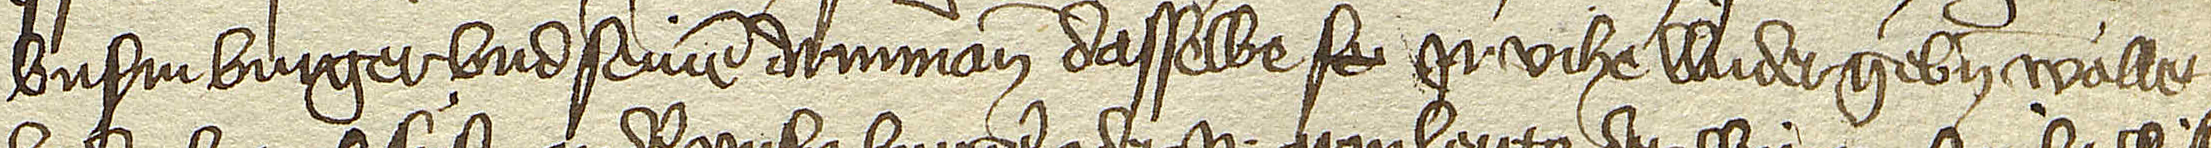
vnſ*m burger vnd ſeine* Armman daſſelbe ſe Ir vihe widergebn* wöllet
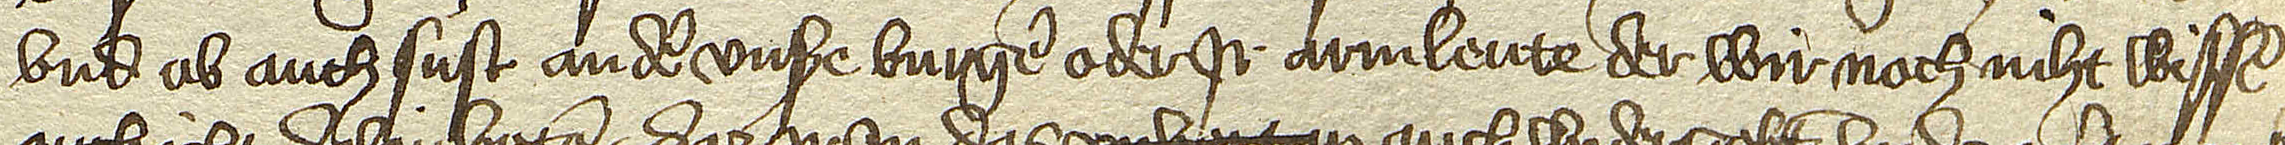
vnd ab auch ſüſt ande* vnſ*e burge* oder Ir armleute der wir noch niht wiſſe*
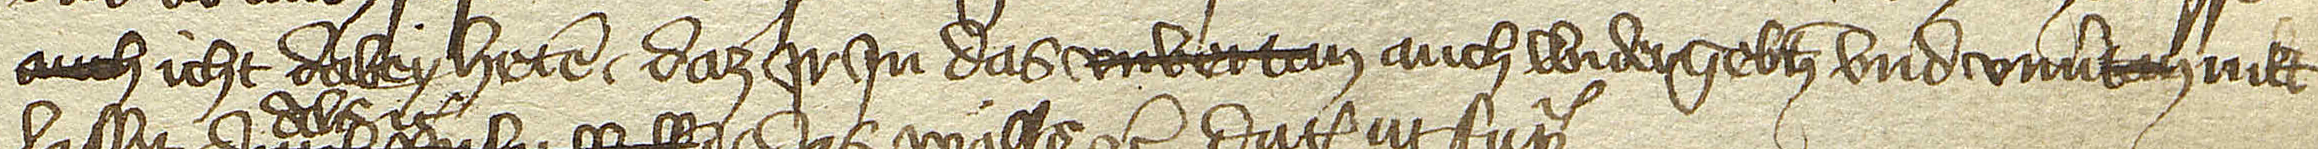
auch icht dabey hete* / daʒ Ir In das vnvertan auch widergebn* vnd vnu*tan richt
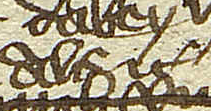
Als ec*
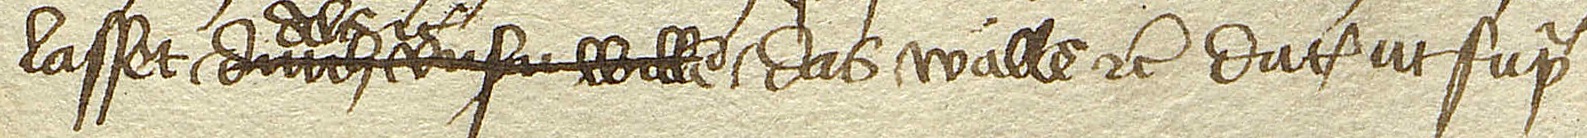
laſſet / durch vnſ*n wille* / das wölle* ec* dat* ut ſup*
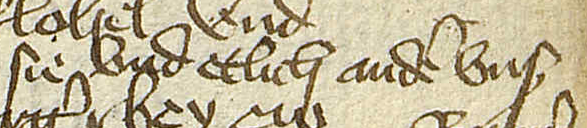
ſie vnd etlich ande* vnſ*
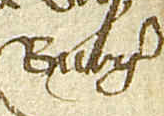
Burg*
